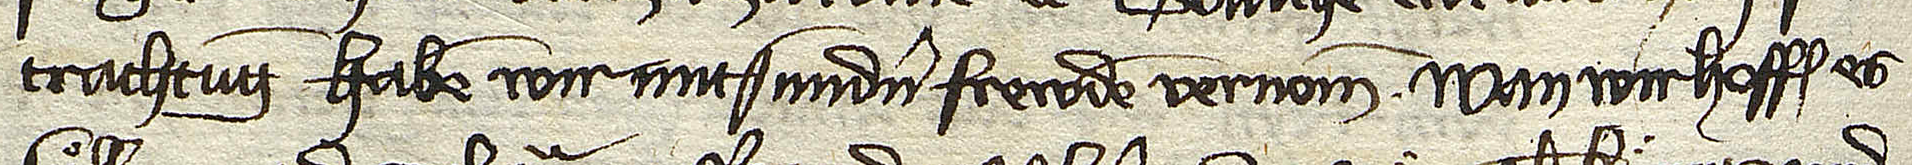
trachtu*g habe* wir mit ſund*n frewde* vernom* . Wan wir hoff* es
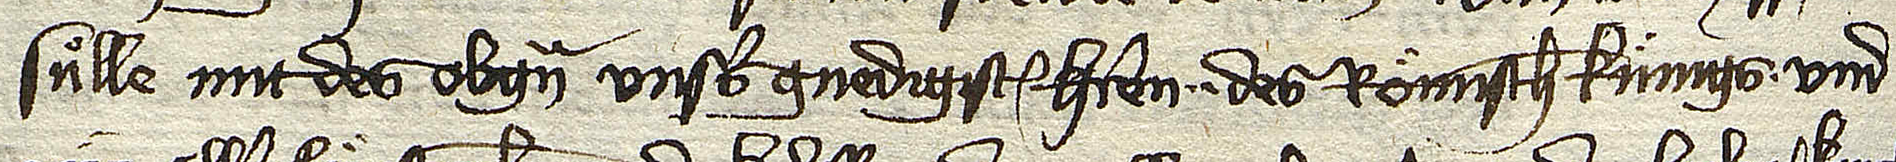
ſülle mit des obg*n vnſ*s gnedigiſt* h*ren ~ des Römiſch* künigs . vnd
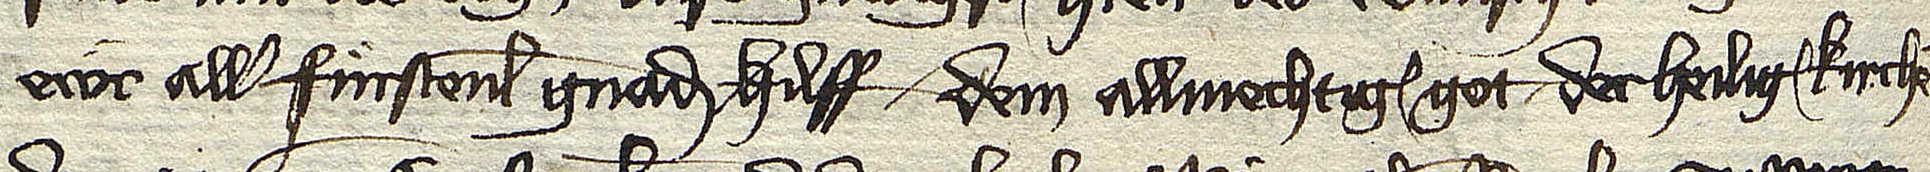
ewr all* fürſtenl* gnad* hilff / dem allmechtig* got / der heilig* kirche*
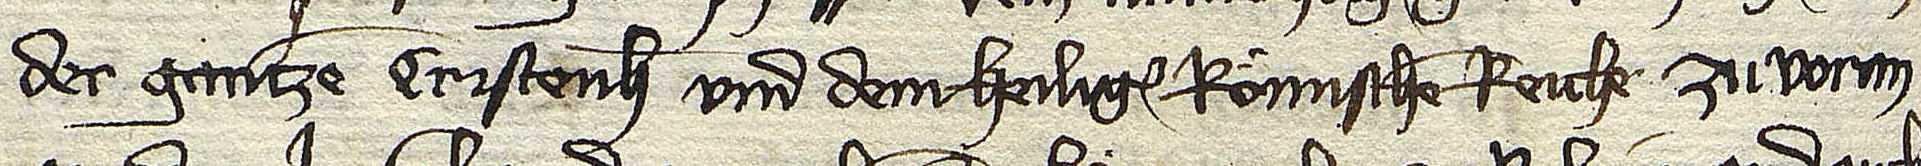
der gancʒe* Criſtenh* vnd dem heilig* Römiſche* Reiche . ʒu voran
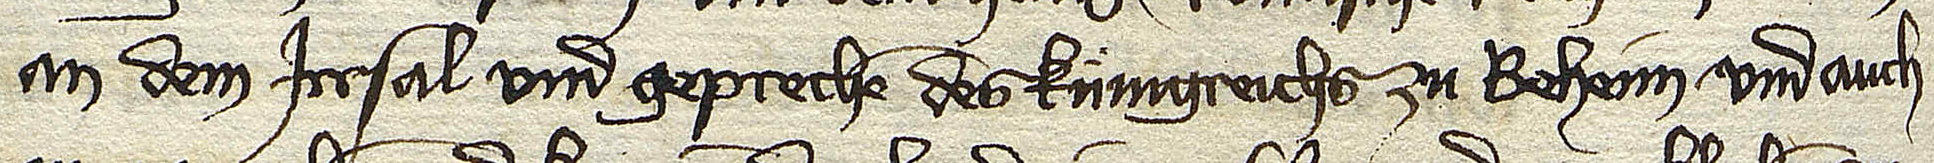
an dem Irrſal vnd gepreche* des künigreichs ʒu Beheim vnd auch
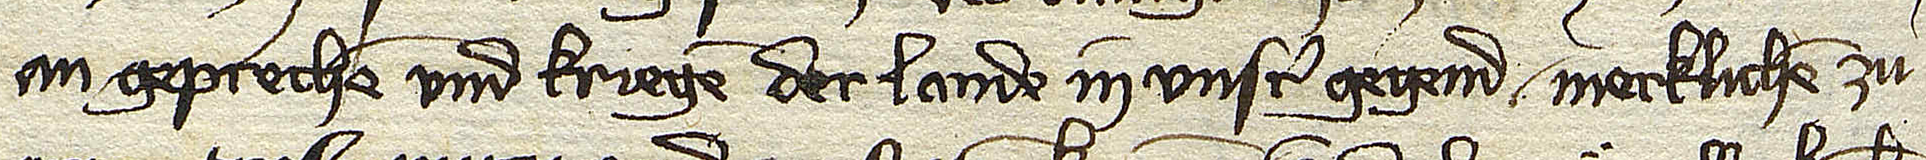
an gepreche* vnd kriege* der lande in vnſ*r gegend / merkliche* ʒu
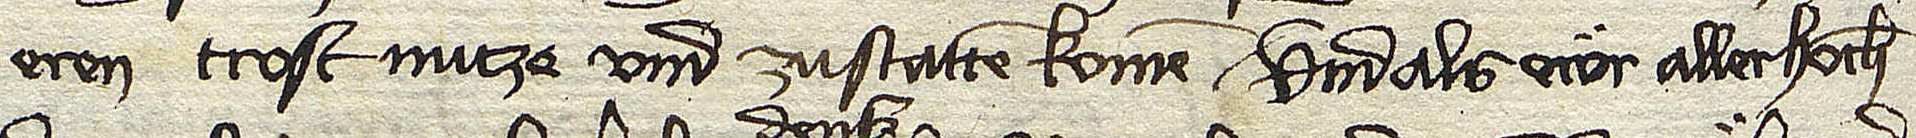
eren troſt nucʒe vnd ʒuſtatte* kome* / Vnd als ewr aller hoch*
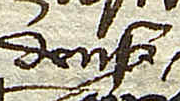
denſ*
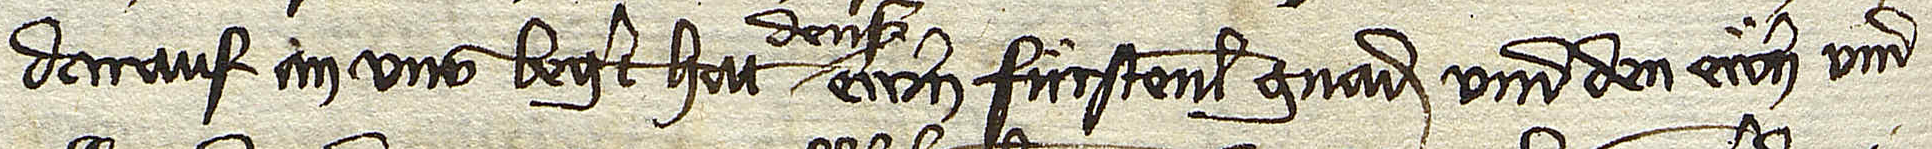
darauf an vns beg*t hat ew*n fürſtenl* gnad* vnd den ew*n vnd
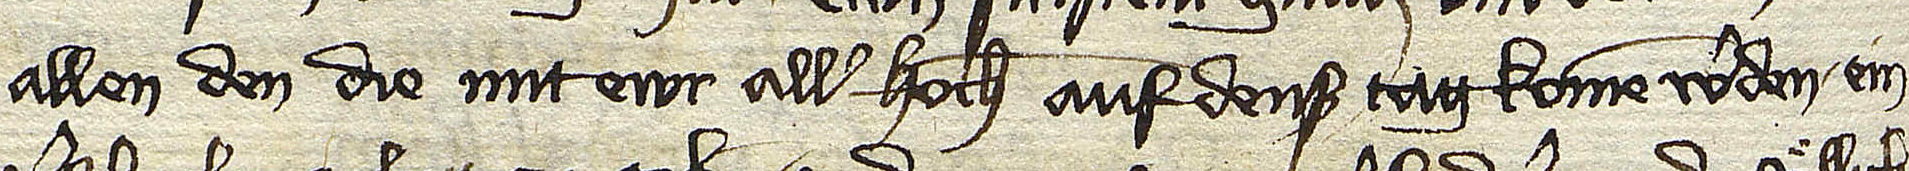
allen den die mit ewr all* hoch* auf denſ* tag kome* w*den / ein
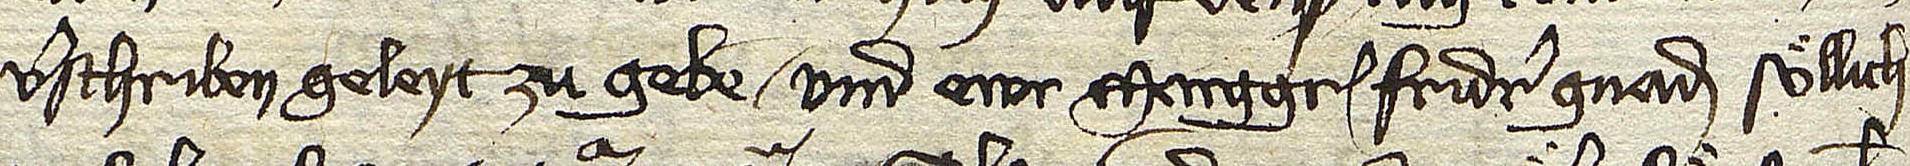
v*ſchriben geleyt ʒu gebe* / vnd ewr Marggr* fridr* gnad* ſöllich
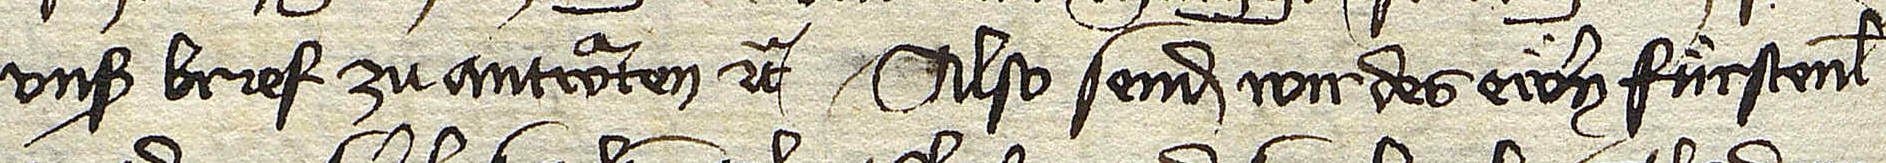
vnſ* brief ʒ antw*ten ec* / Alſo ſend* wir des ew*n fürſtenl*
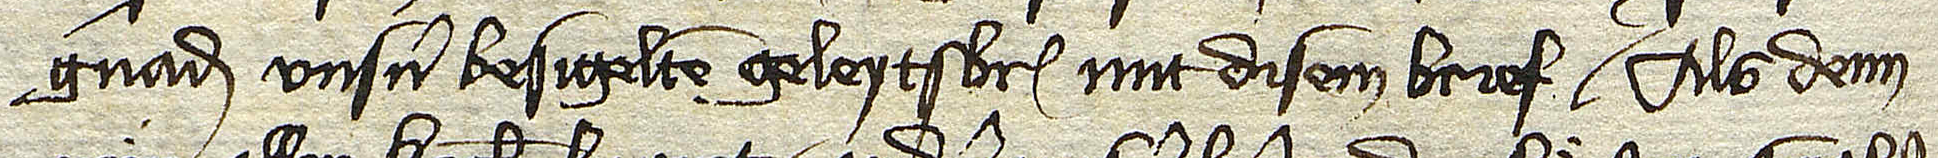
gnad* vnſ*n beſigelte* geleytſbr* mit diſem brief / Als denn
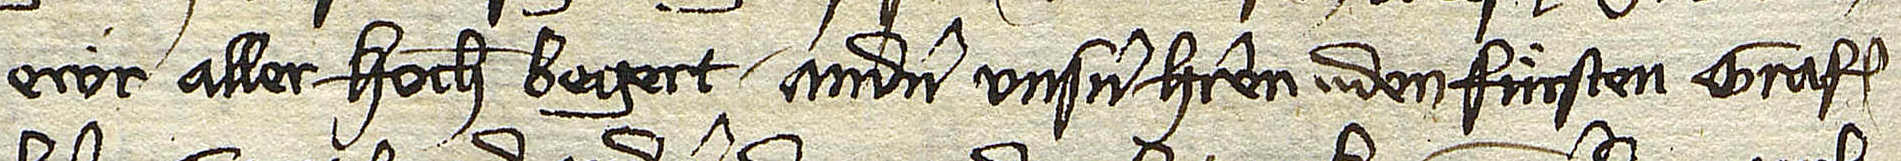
ewr aller hoch* begert / and*n vnſ*n h*ren ~ den fürſten Graf*
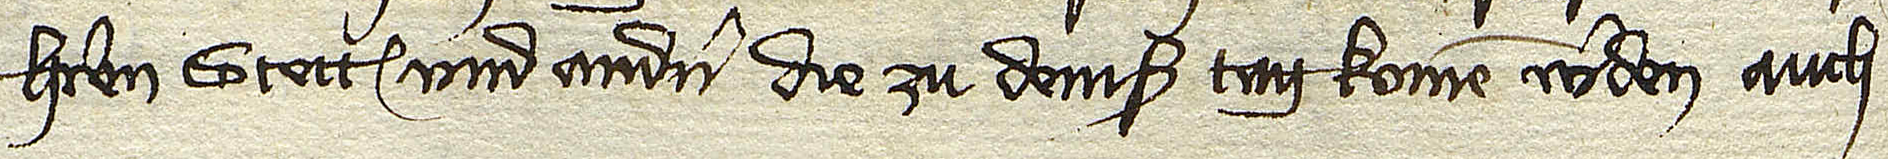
h*ren Stett* vnd and*n die ʒu demſ* tag kome* w*den auch
